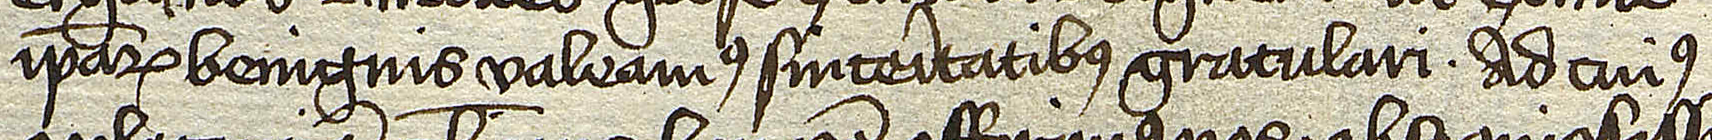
ip*ar* benignis valeam* ſince*itatib* graculari . Ad cui*
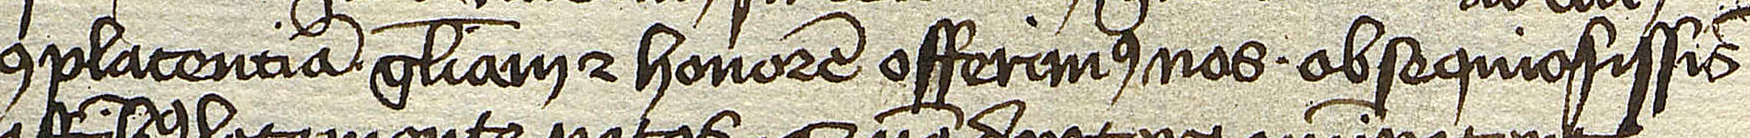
*placentia* . gl*iam @ honore* offerim* nos . obſequioſiſſi*s
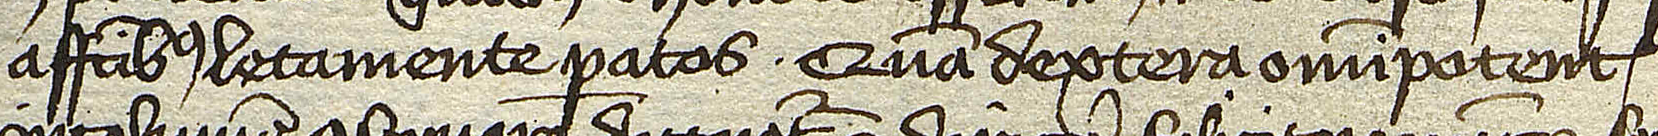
aff*c*ib* letamente p*atos . Qua* dextera om*ipotent*
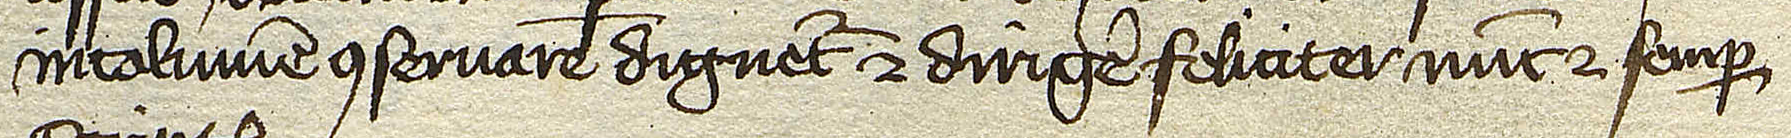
incolume* *ſeruare dignet* @ dirige* feliciter nu*c @ ſemp*
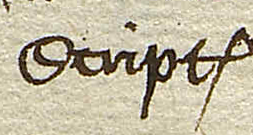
Script*
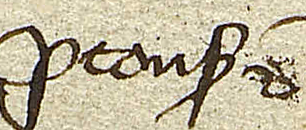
P*conſ* ec*
